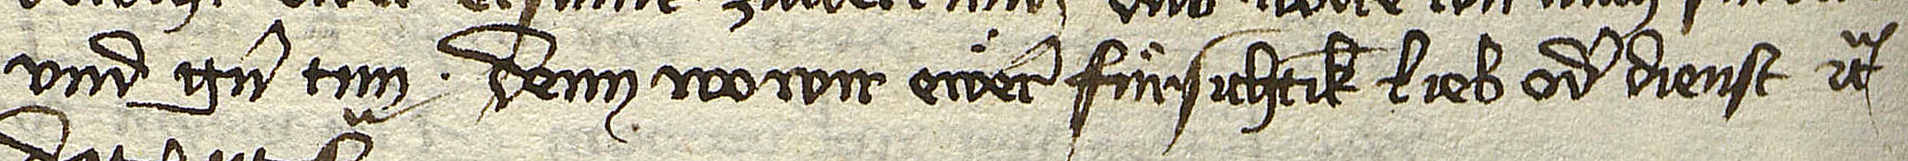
vnd g*n tun . Denn wo wir eẅer* fürſichtik* lieb od* dienſt ec*
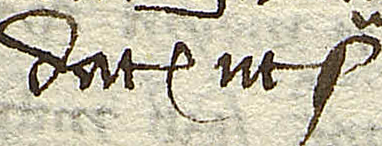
Dat* ut ſ*
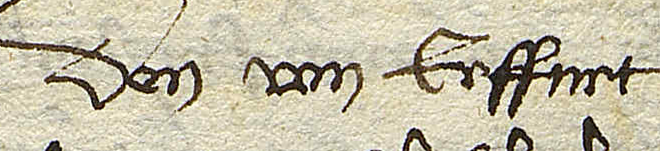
Den von Erffurt
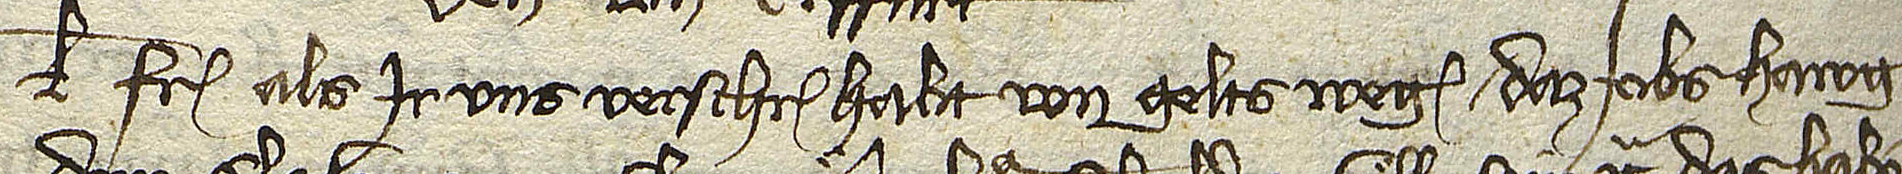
L* fr* als Ir vns verſchr* habt von gelts weg* / daʒ Iobs hawg
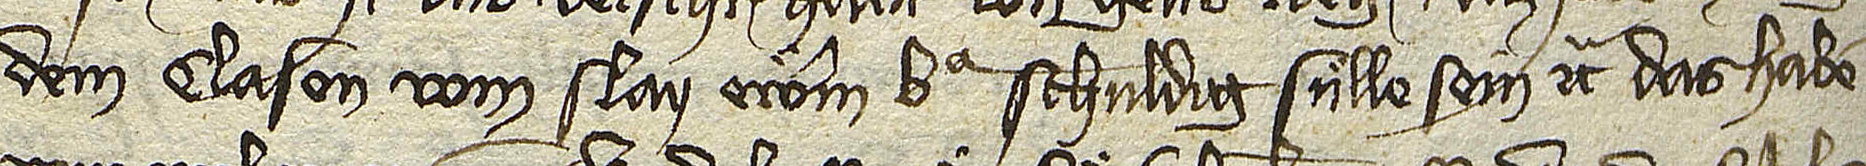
dem Claſen vom ſlay eẅ*m b* ſchuldig ſülle ſein ec* das habe*
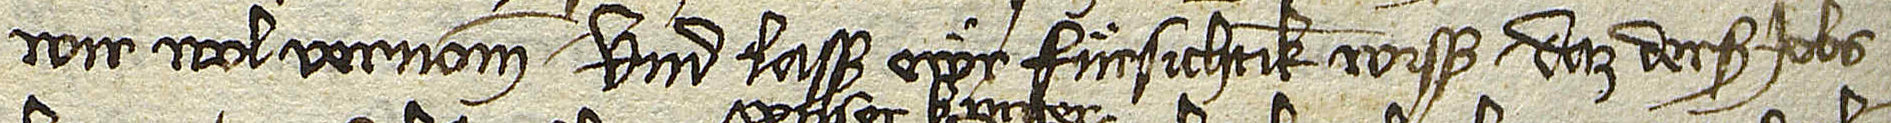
wir wol vernom* / Vnd laſſ* eẅr fürſichtik* wiſſ* / daʒ derſ* Iobs
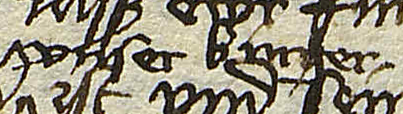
vnſer burger
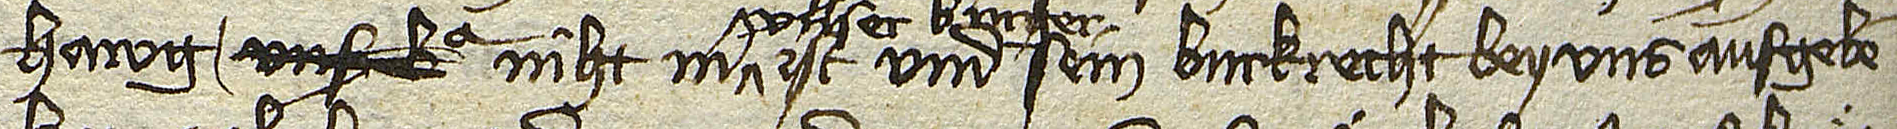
hawg / vnſ* b* niht m* iſt vnd ſein burkrecht bey vns aufgebe*
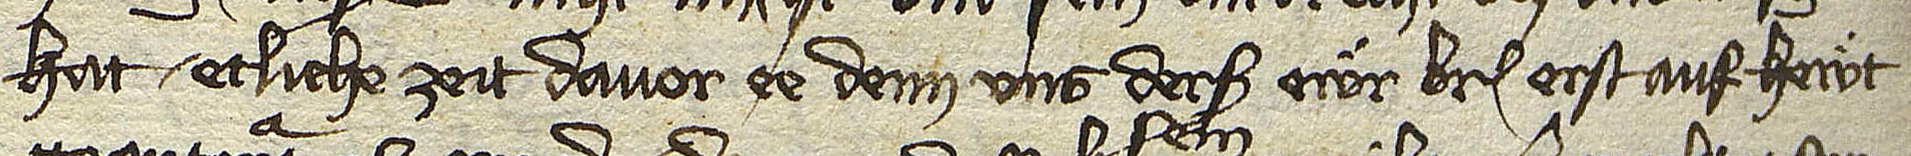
hat / etliche ʒeit dauor ee denn vns derſ* eẅr b*r erſt auf heẅt
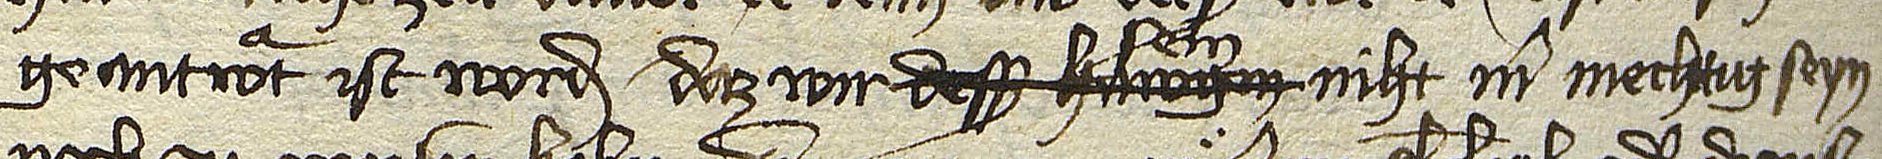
geantw*t iſt word* / daʒ wir deſſ* hawgen niht m* mechtig ſeyn
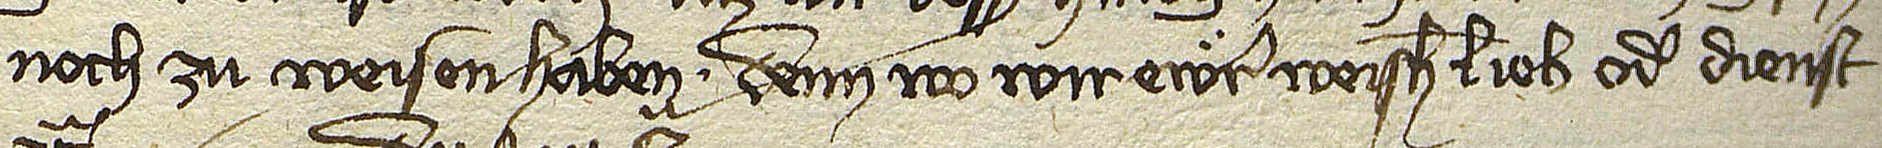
noch ʒu weiſen haben . Denn wo wir eẅr* weiſh* lieb od* dienſt
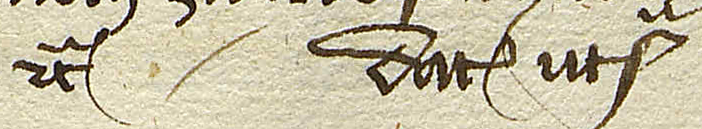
ec* / Dat* ut ſ*
